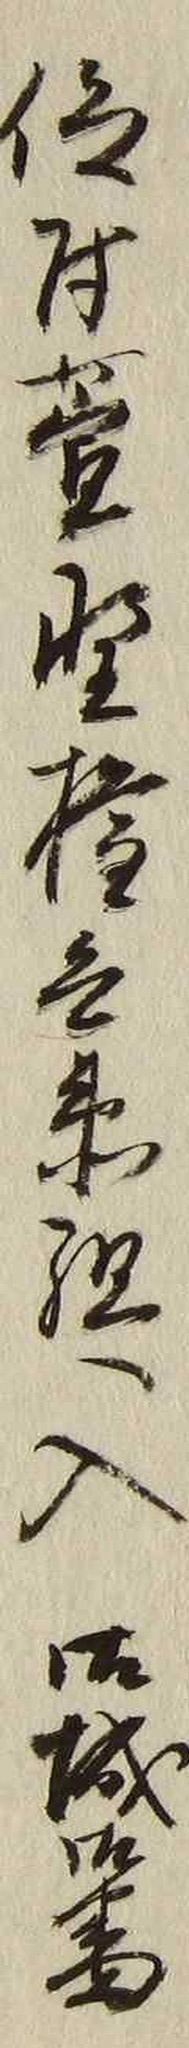仰付萱野権兵衛組へ入御城御番
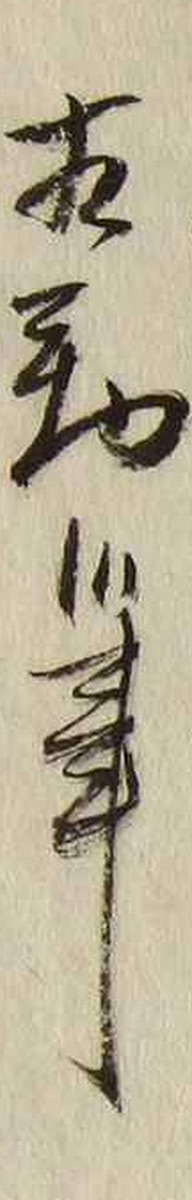相勤候事
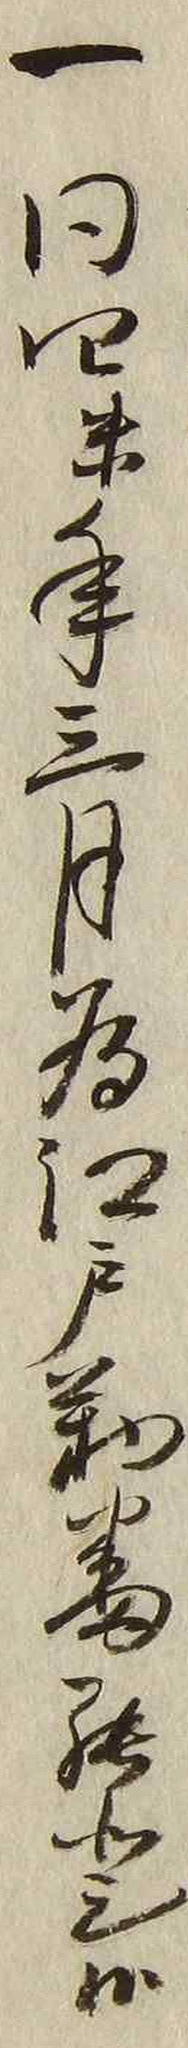一同四未年三月為江戸勤番罷登候

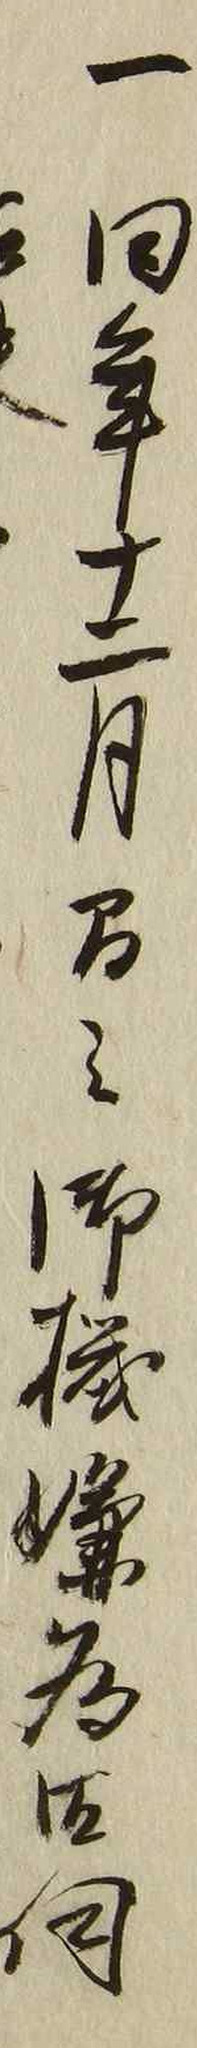一同年十二月間之御機嫌為御伺
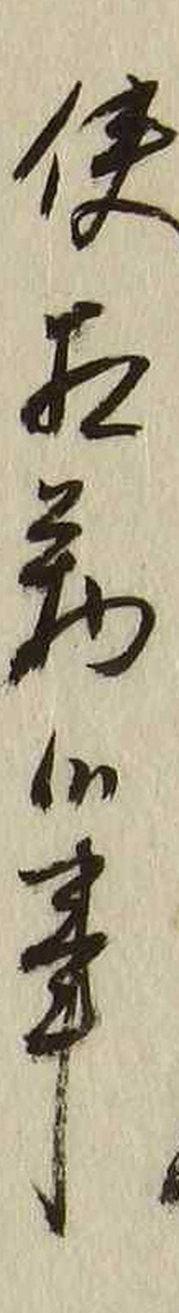使相勤候事
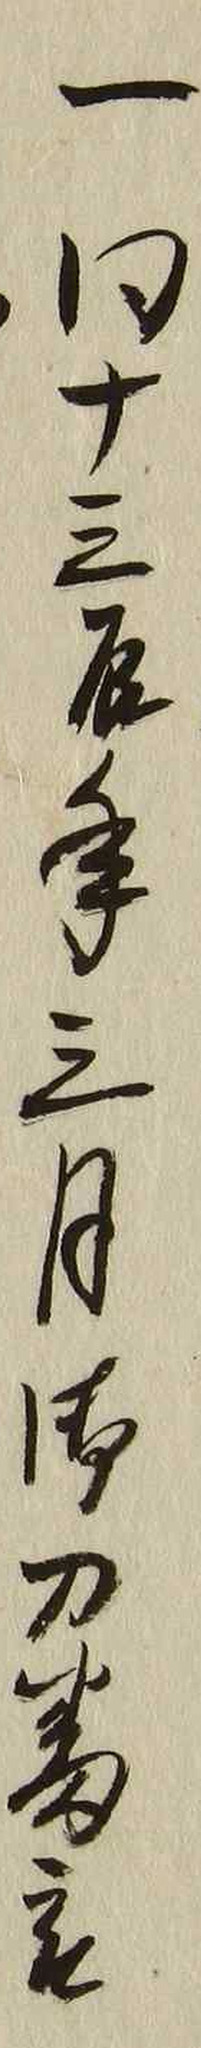一同十三辰年三月御刀番被
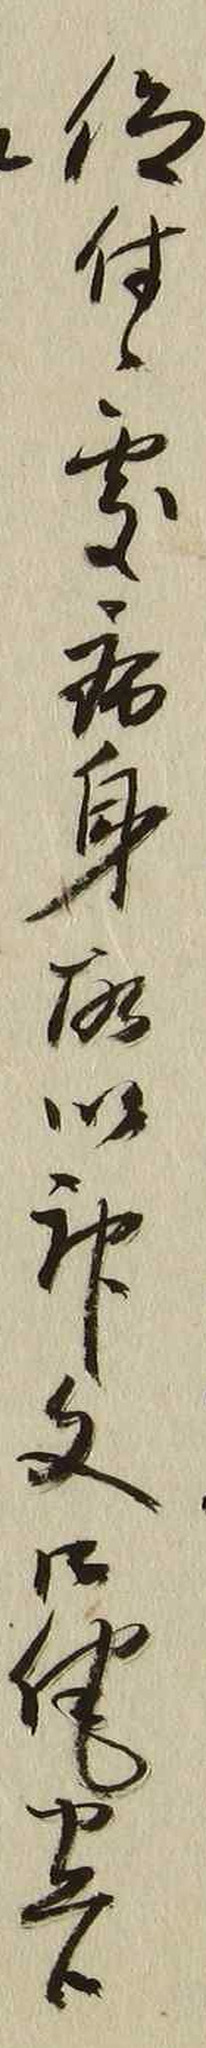仰付候処病身故以神文御侘申上候
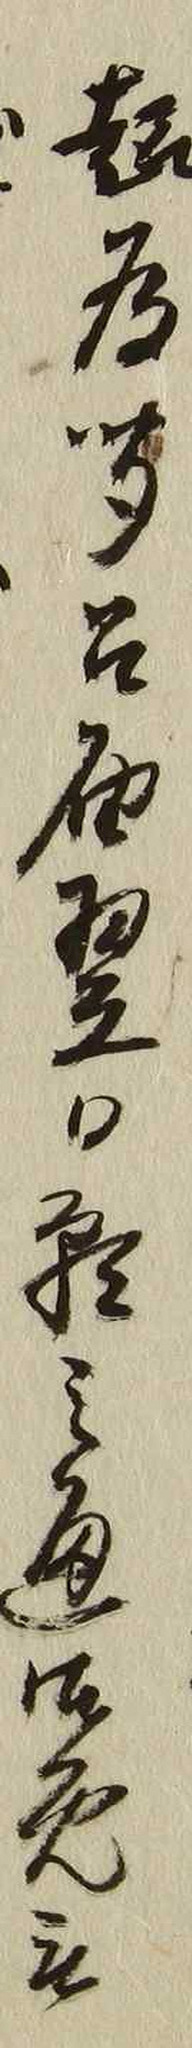趣為聞召届翌日願之通御免被
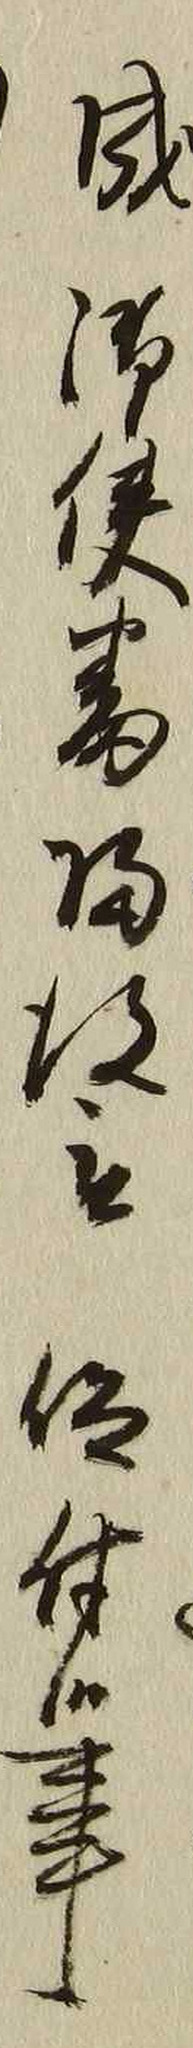成御使番帰役被仰付候事
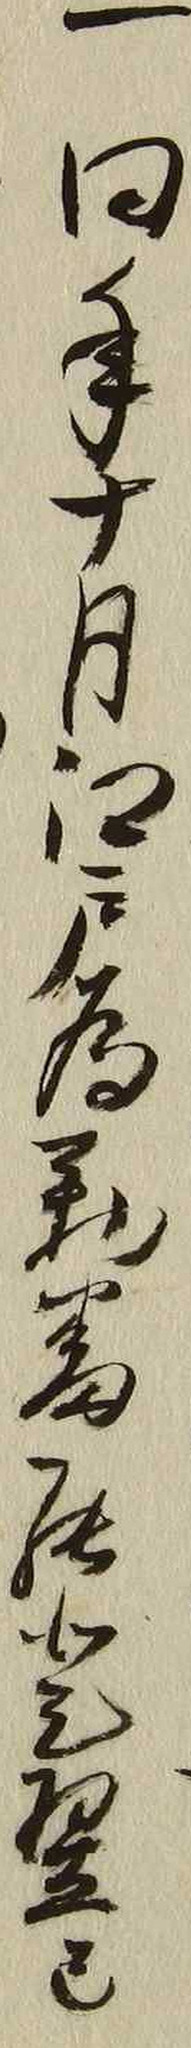一同年十月江戸為勤番罷登翌巳
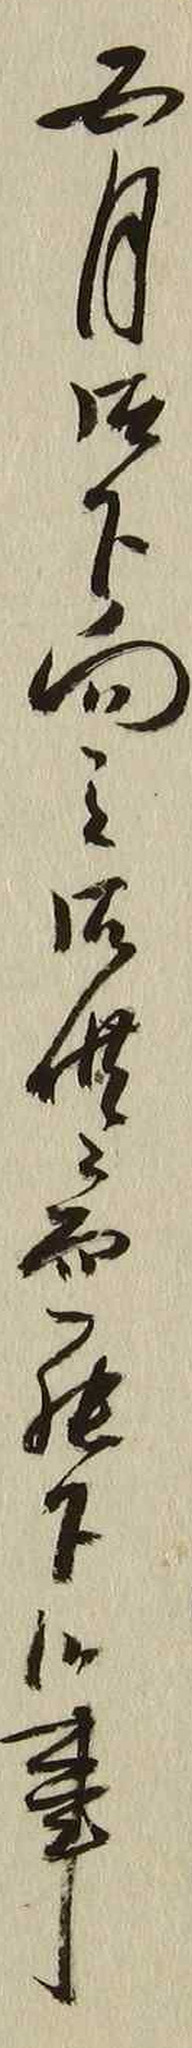五月御下向之御供ニ而罷下候事
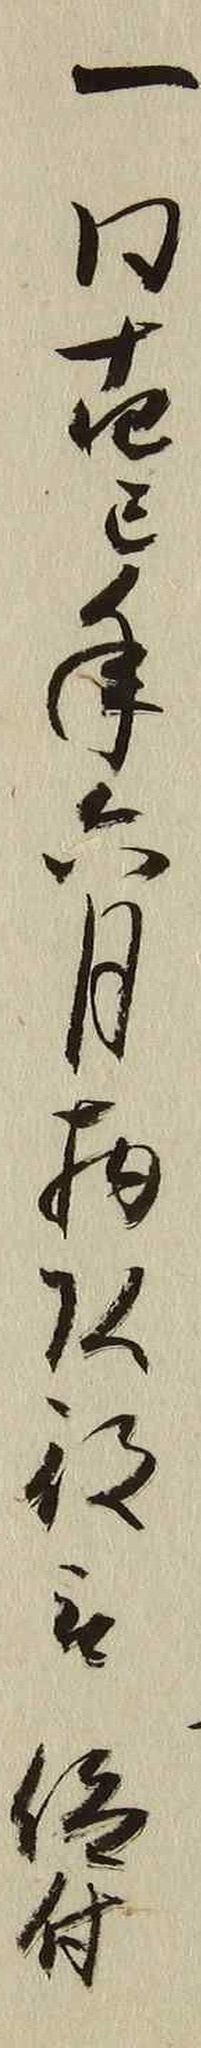一同十四巳年六月物頭役被仰付
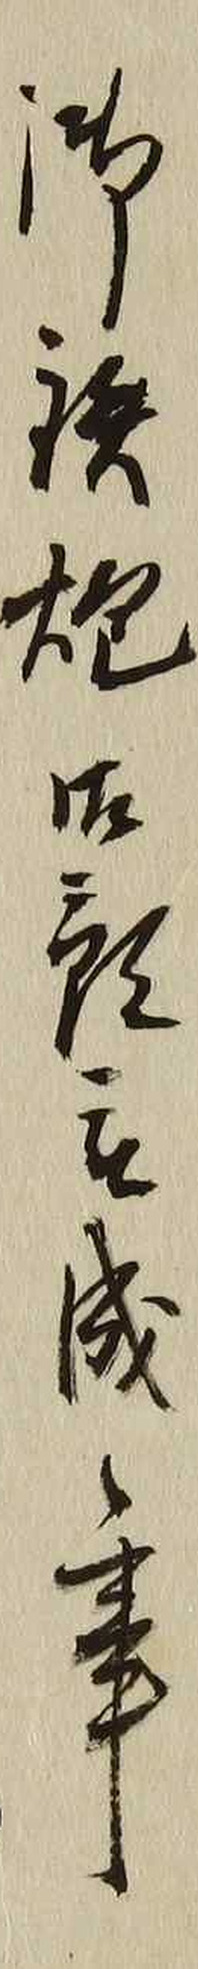御鉄炮御預被成候事
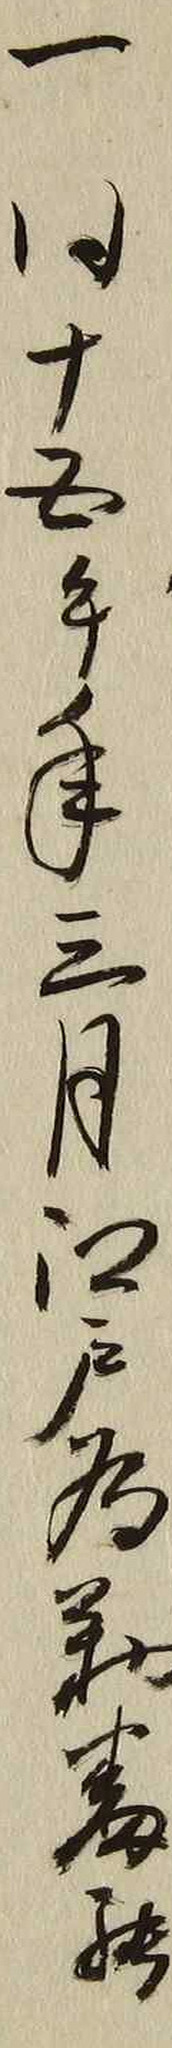一同十五午年三月江戸為勤番罷
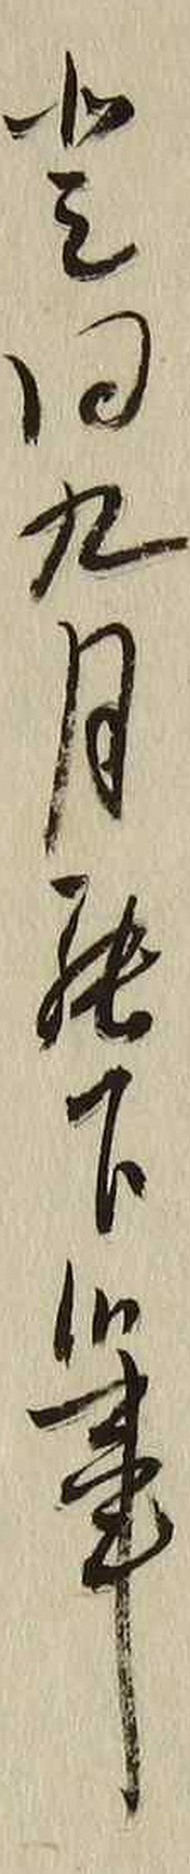登同九月罷下候事
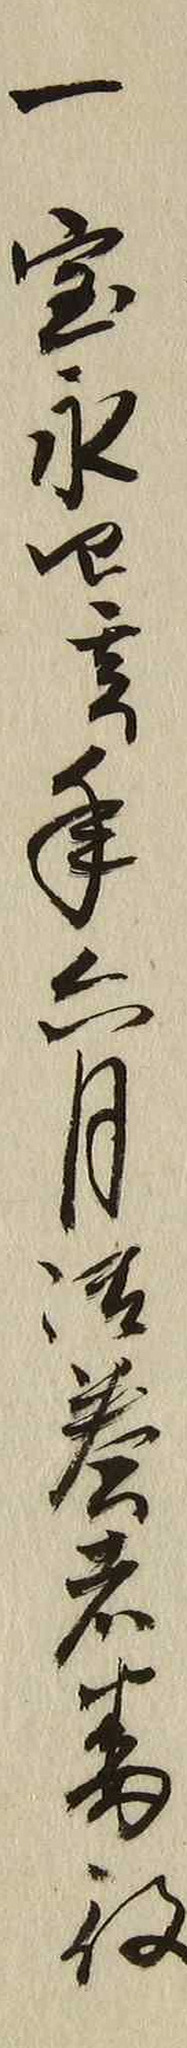一宝永四亥年六月御奏者番役
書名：諸士系譜　巻之349　も之部5
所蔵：会津若松市立会津図書館
